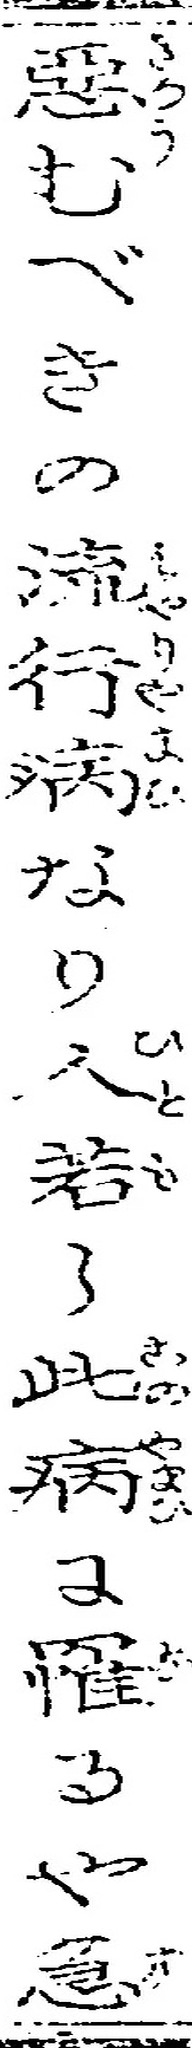惡むべきの流行病なり人若し此病に罹るや急
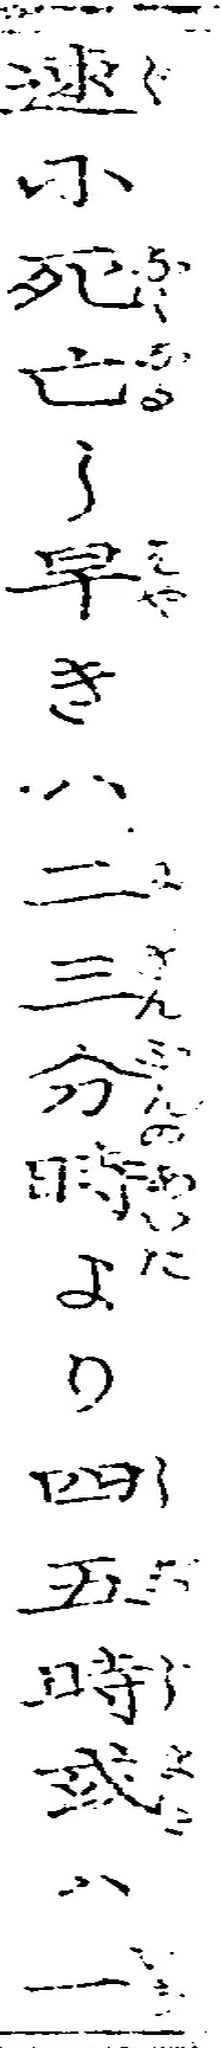速に死亡し早きは二三分時より四五時或は一
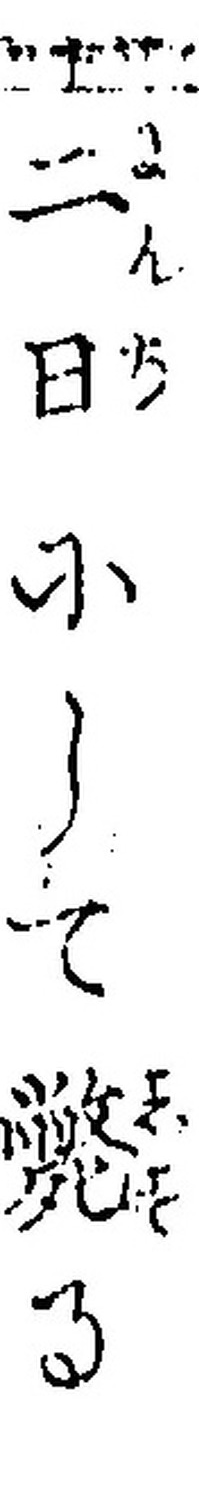二日にして斃る
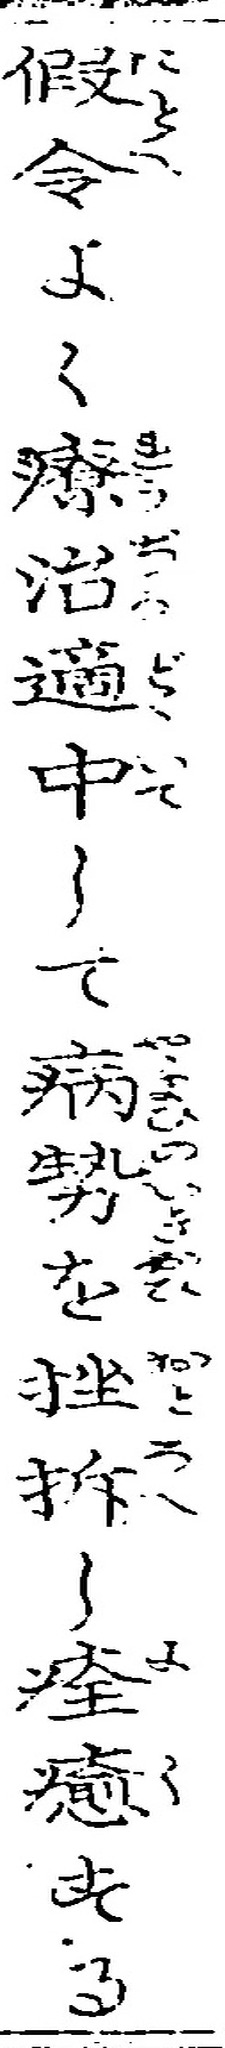假令よく療治適中して病勢を挫折し痊癒する遽かに
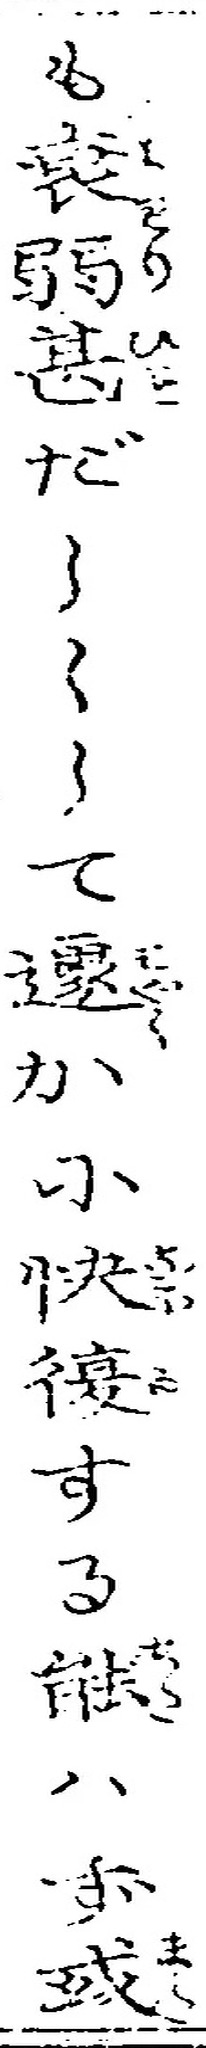も衰弱甚だしくして快復する䏻はず或
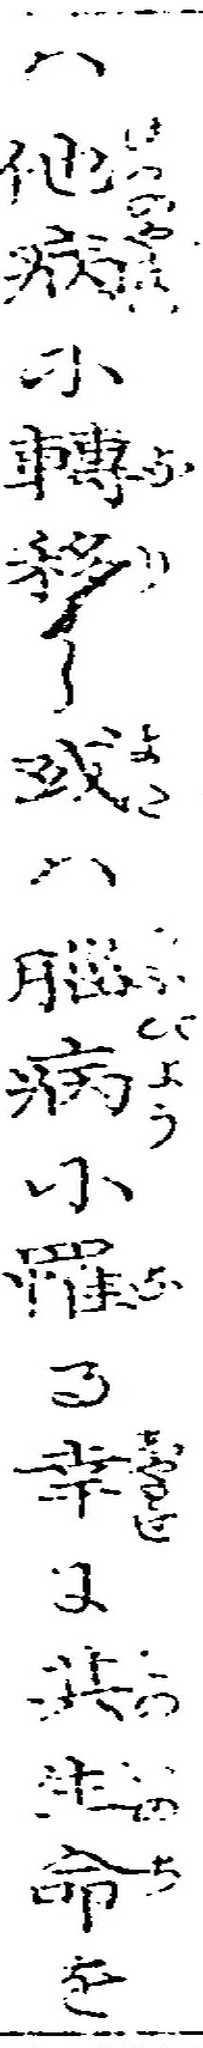は他病に傳移し或は脳病に罹る幸に共生命を

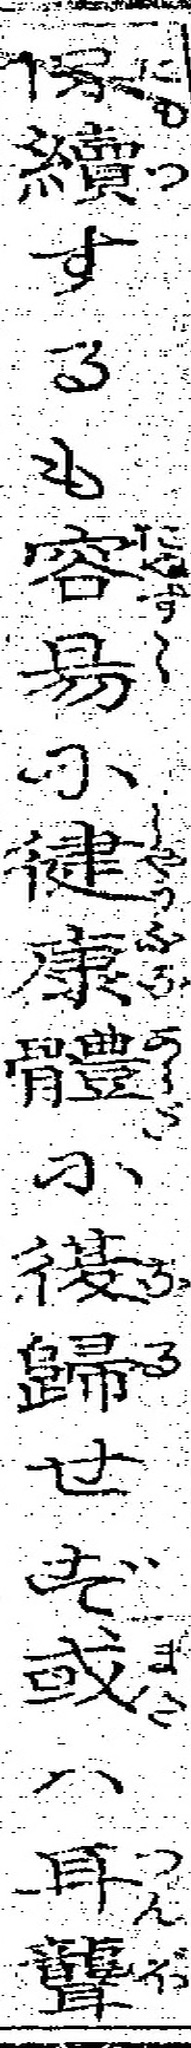保續するも容易に徤康體に復帰せず或は耳聾
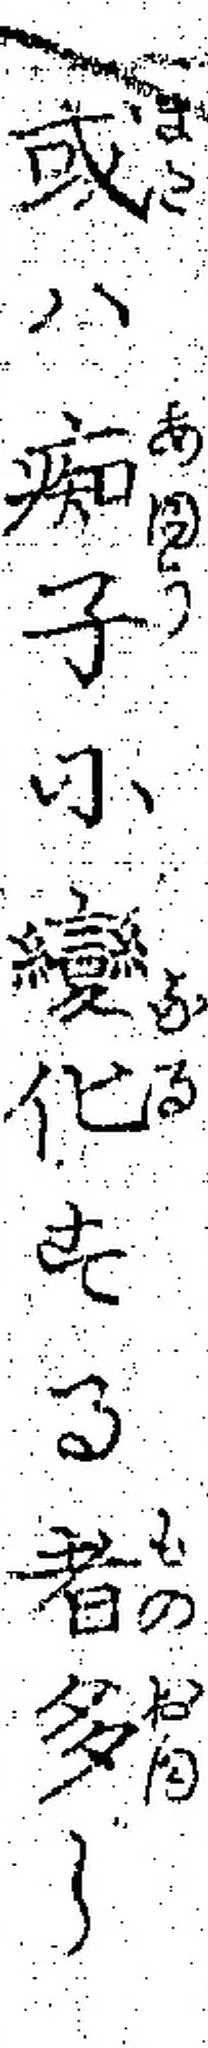或は痴子に変化する者多し
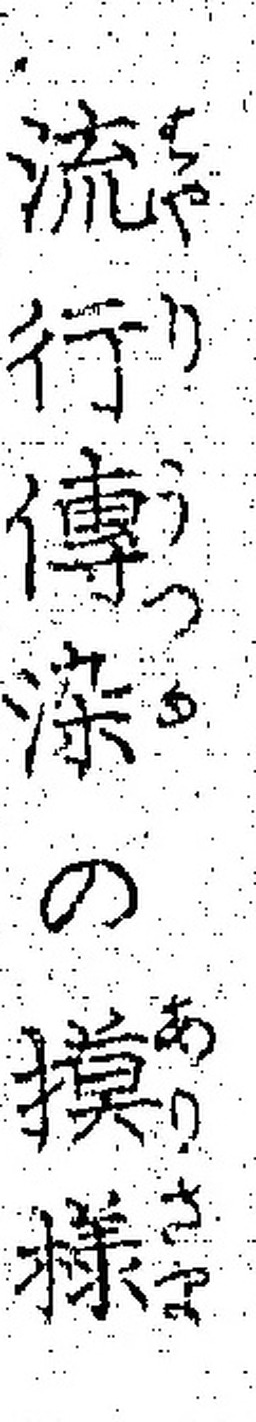流行傳染の模様
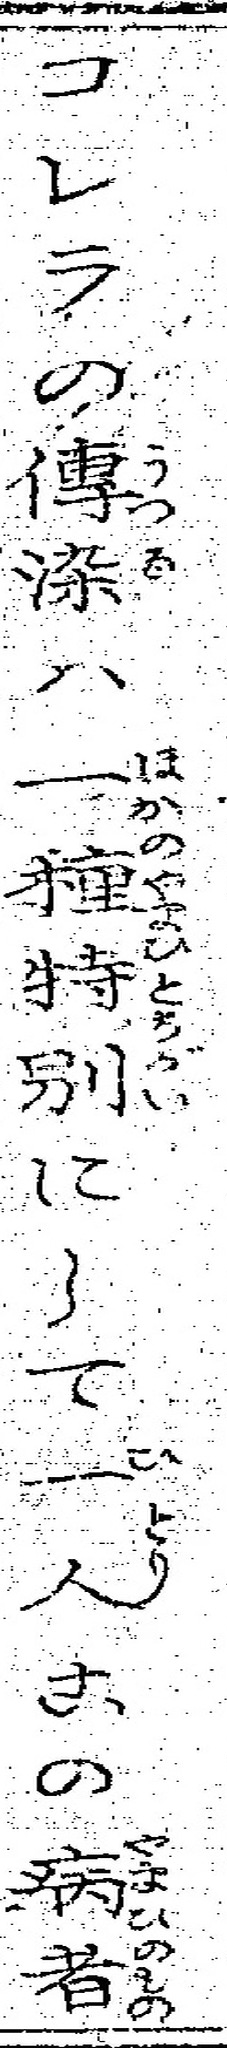コレラの傳染一種特別にして一人この病者
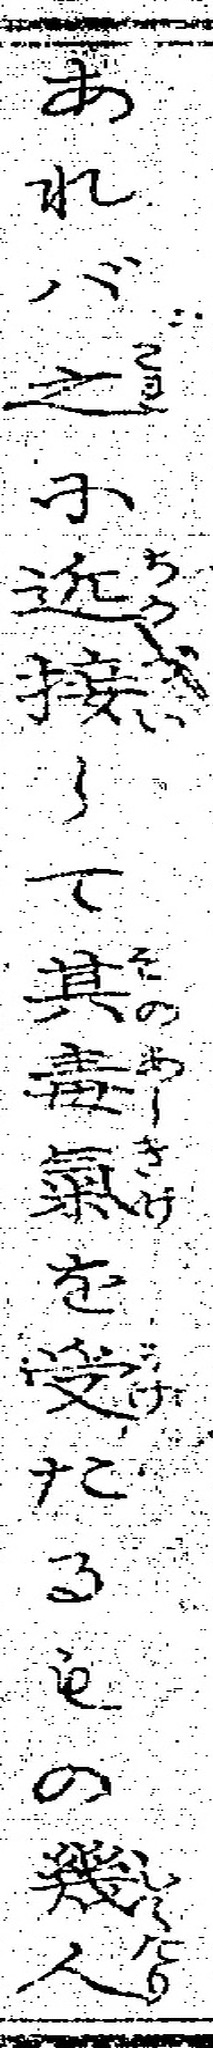あれば之に近接して其毒気を受たるもの幾人
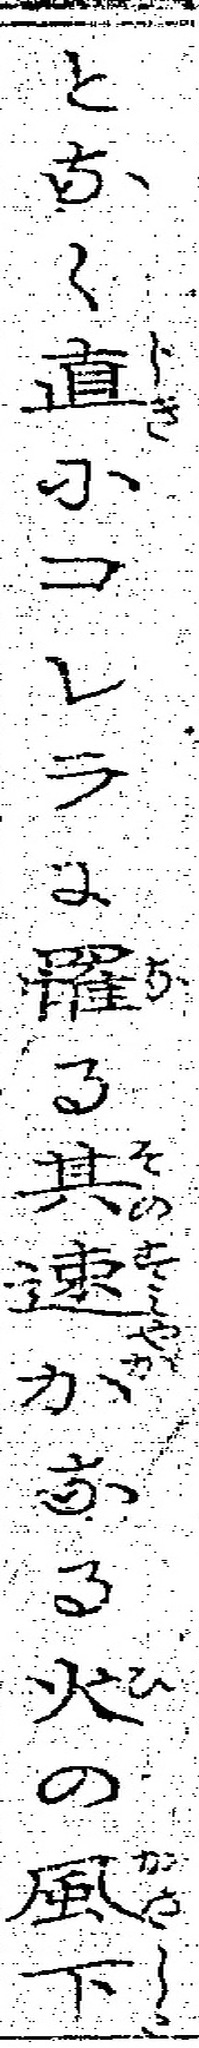となく直にコレラに罹る其速かなる火の風下
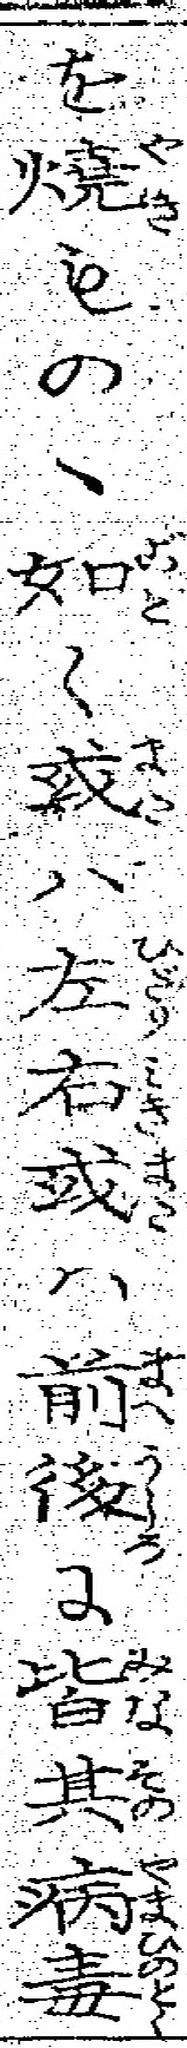を焼ものゝ如く或は左右或は前後に皆其病毒
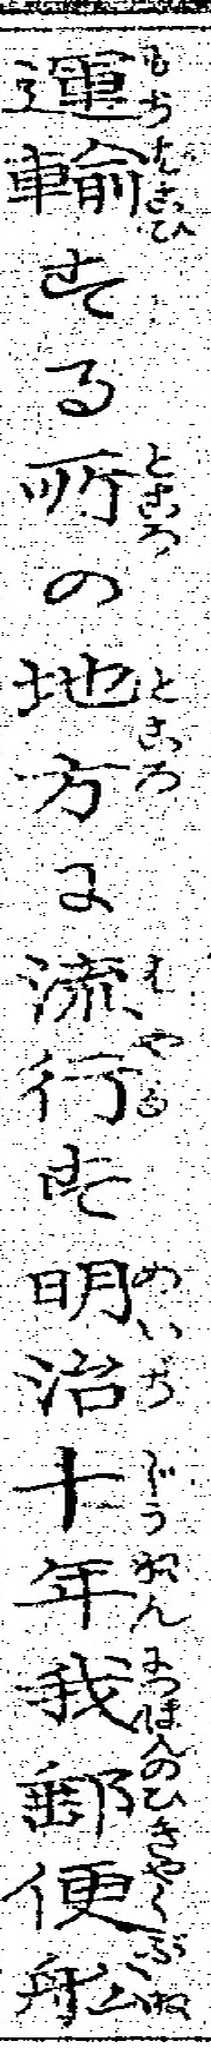運輸する所の地方に流行す明治十年我郵便船
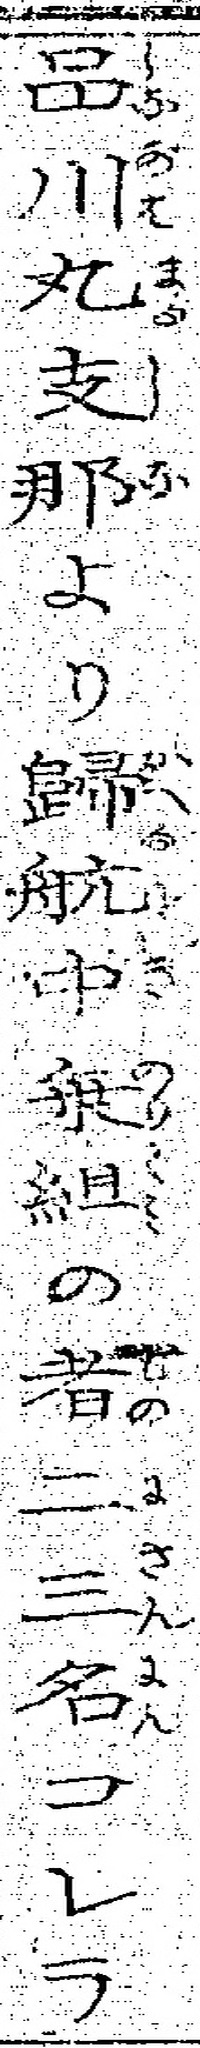品川丸支那より帰港中乗組の者二三名コレラ
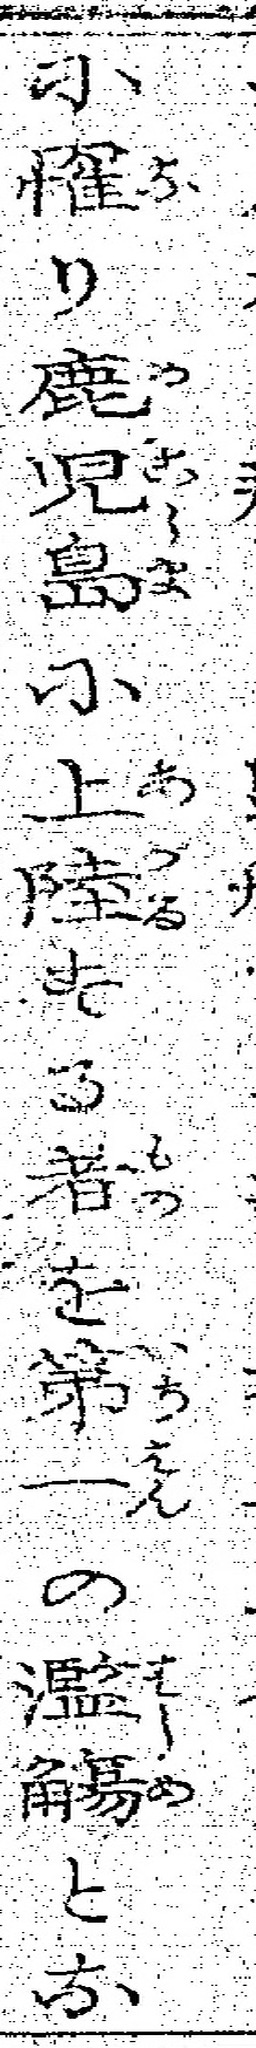に罹り鹿児島に上陸する者を第一の濫觴とな
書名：虎列剌予防民間の心得
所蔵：国立国会図書館 National Diet Library, JAPAN
